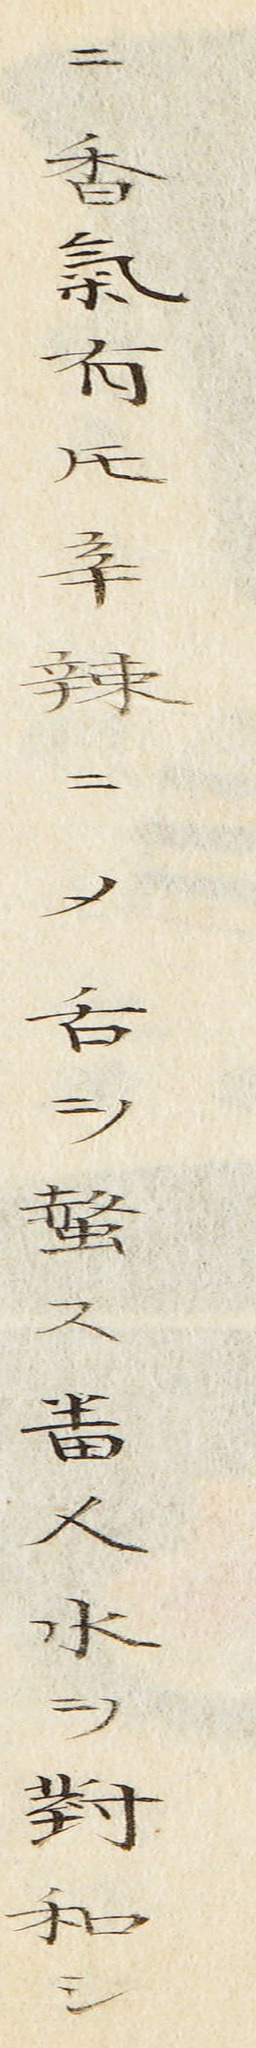ニ香気有トモ辛辣ニシテ舌ヲ螫ス蕃人水ヲ対和シ
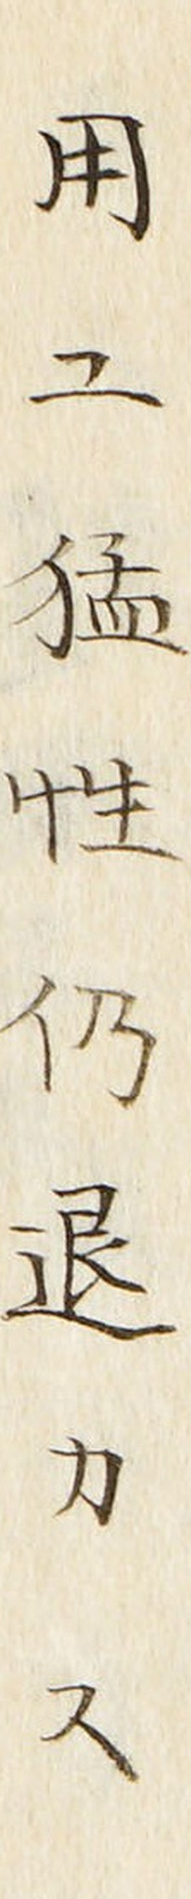用ユ猛性仍退カス
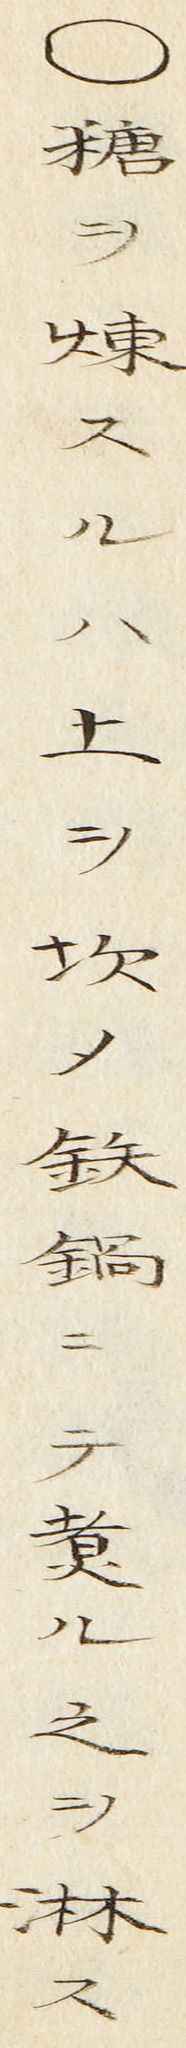〇糖ヲ煉スルハ上ヲ坎シテ鉄鍋ニテ煮ル之ヲ淋ス
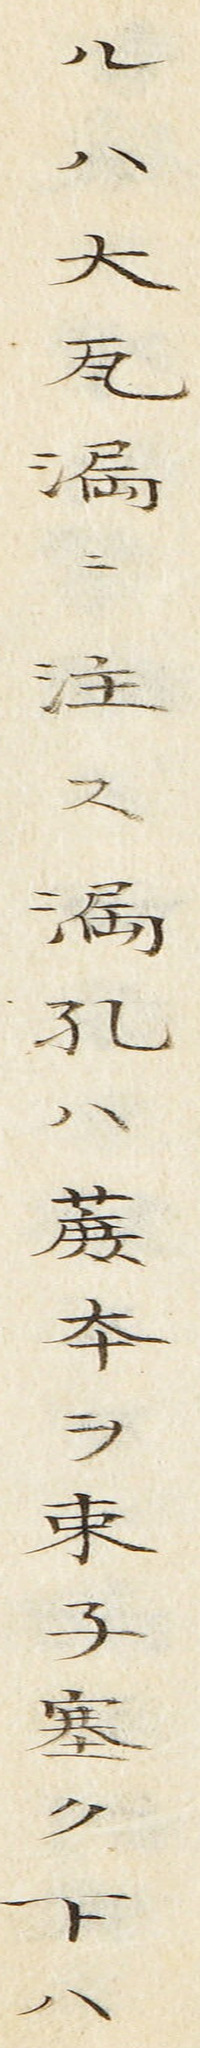ルハ大瓦漏ニ注ス漏孔蔗蔗本ヲ束子塞ク下ハ
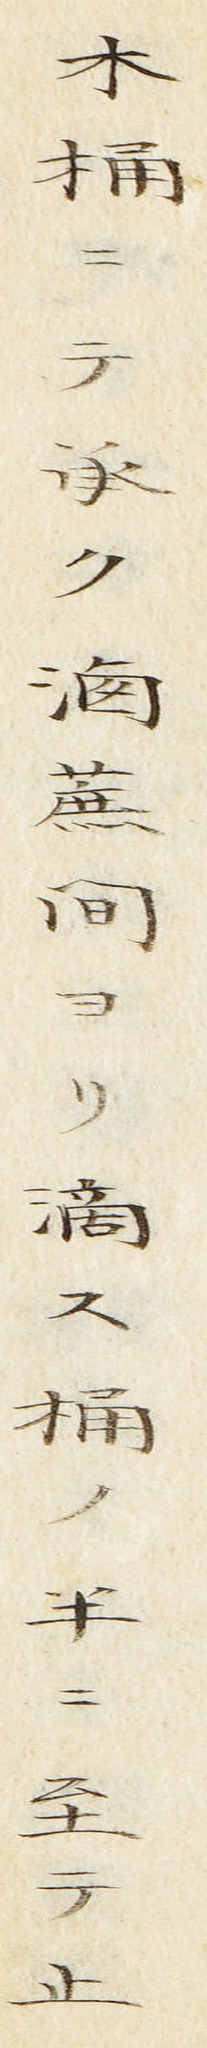木桶ニテ承ク滷蔗間ヨリ滴ス桶ノ半ニ至テ止
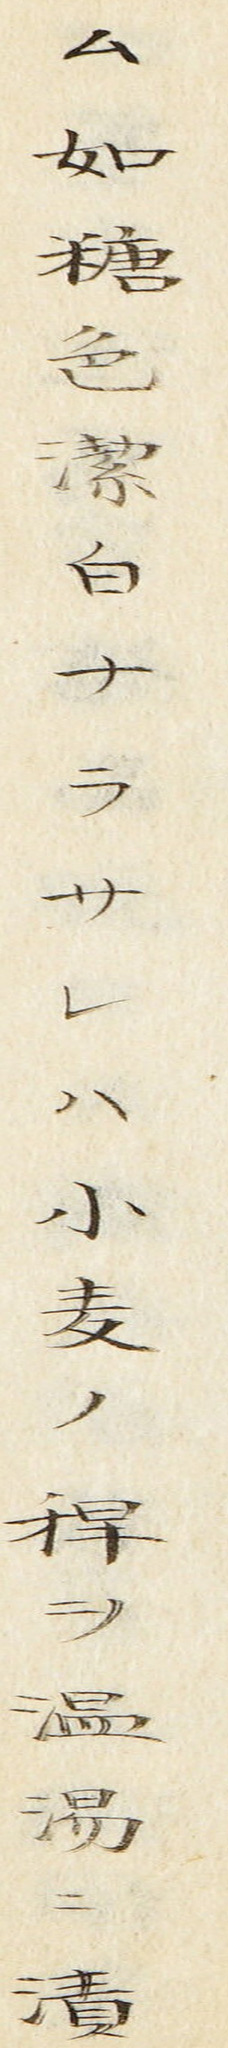ム如糖色潔白ナラサレハ小麦ノ稈ヲ温湯ニ漬
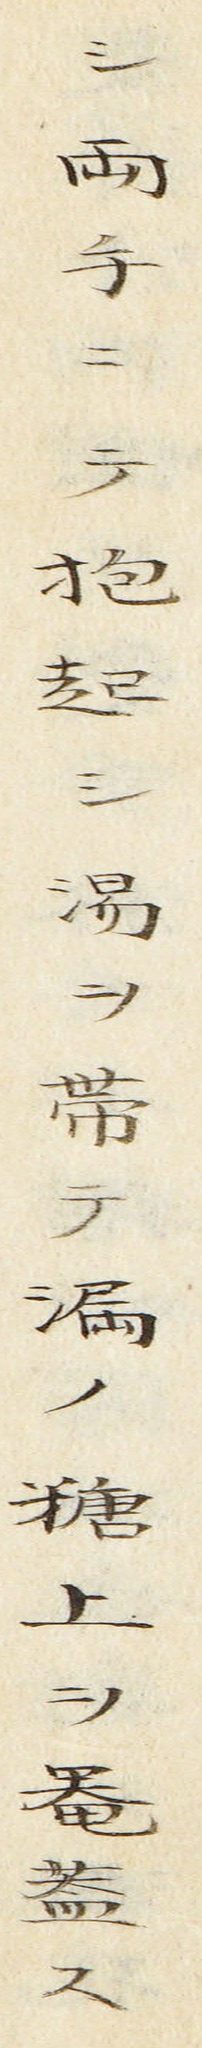シ両手ニテ抱起シ湯ヲ帯テ漏ノ糖上ヲ罨蓋ス

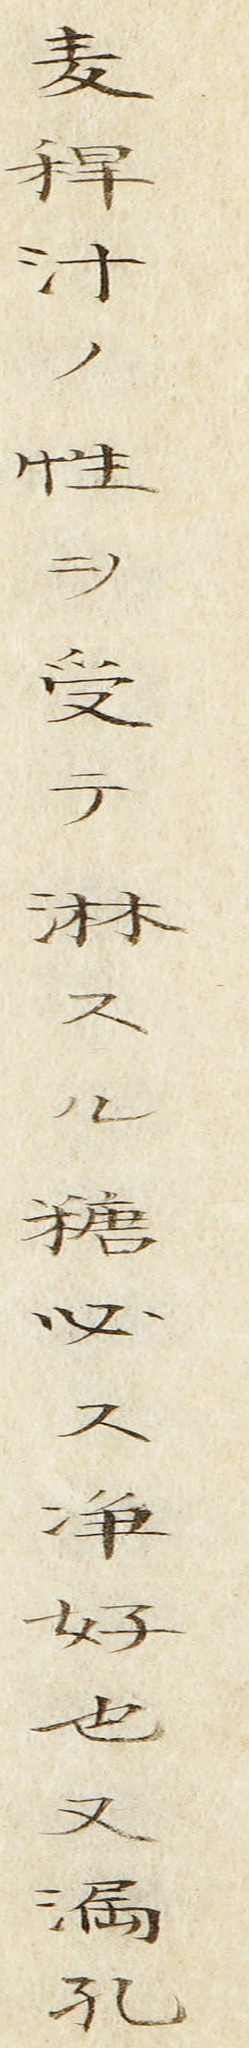麦稈汁ノ性ヲ受テ淋スル糖必ス浄好也又漏孔
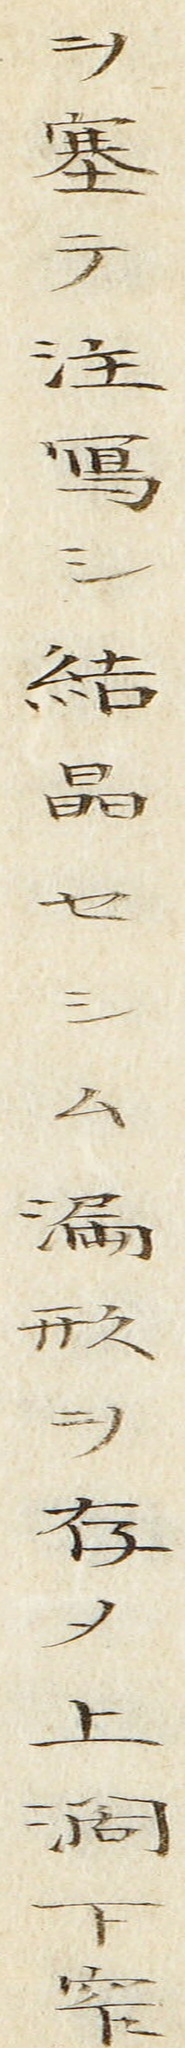ヲ塞テ注写？シ結晶セシム漏形ヲ存シテ上濶下窄
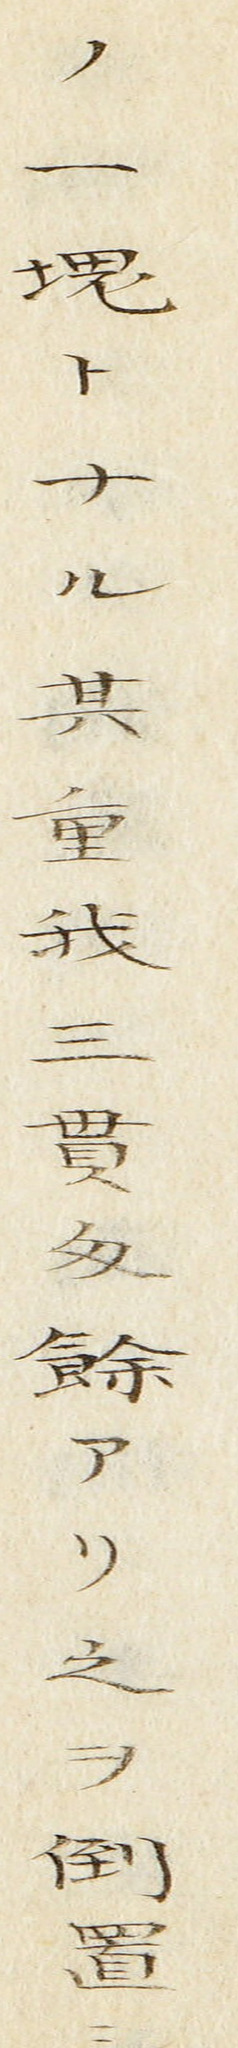ノ一塊トナル其重我三貫匁余アリ之ヲ倒置シ
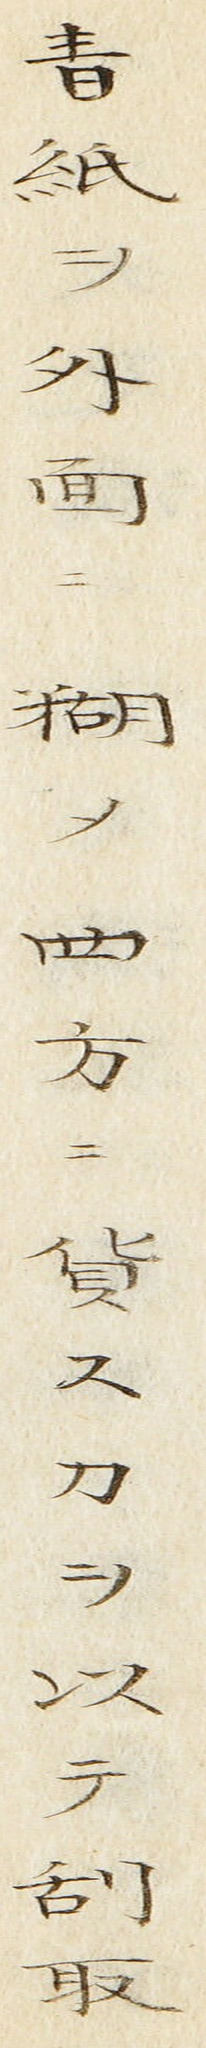青紙ヲ外面ニ糊シテ四方ニ貨ス刀ヲ以テ刮取シ
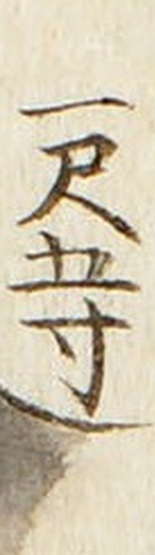一尺五寸
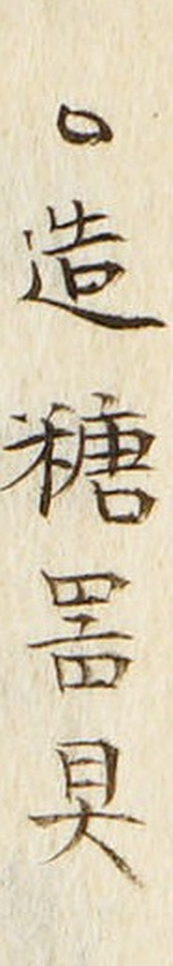〇造糖器具
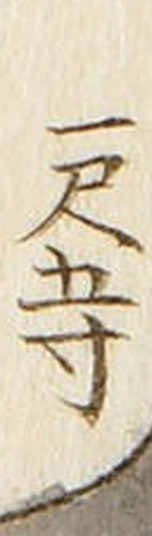一尺五寸
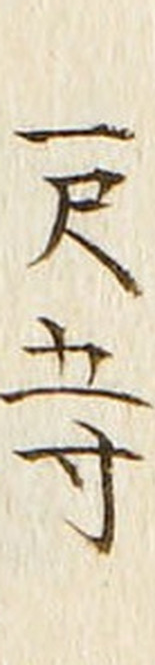一尺五寸
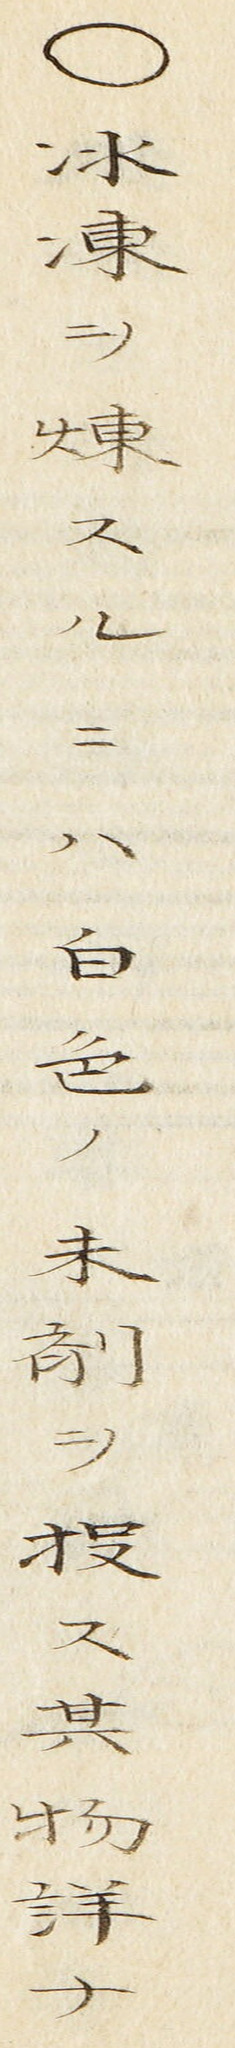〇冰凍ヲ煉スルニハ白色ノ未剤ヲ投ス其物詳ナ
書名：蕃談
